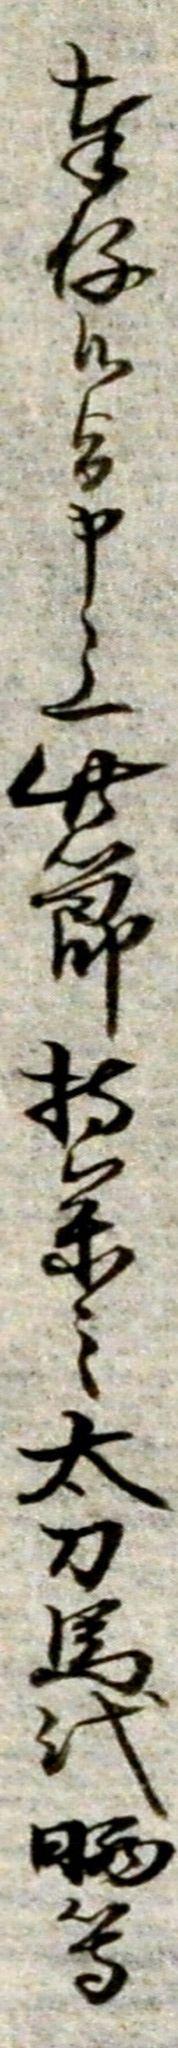奉存候旨申上此節持参之太刀馬代晒等
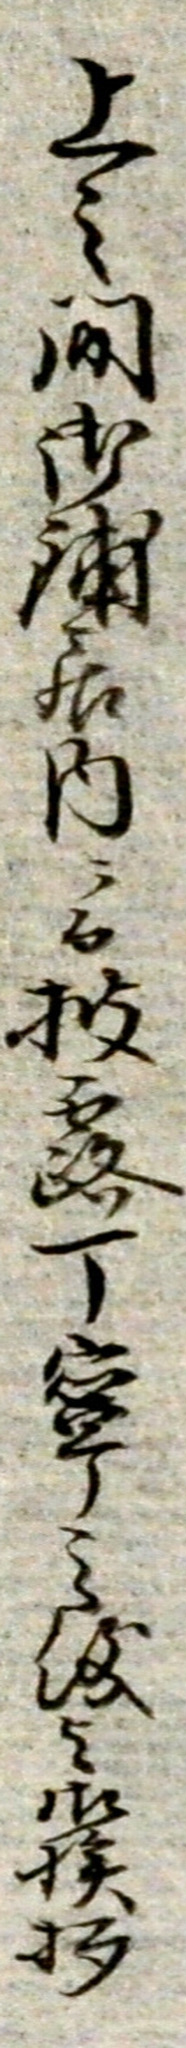上之間御鋪居内ニ而披露丁寧之儀者御挨拶
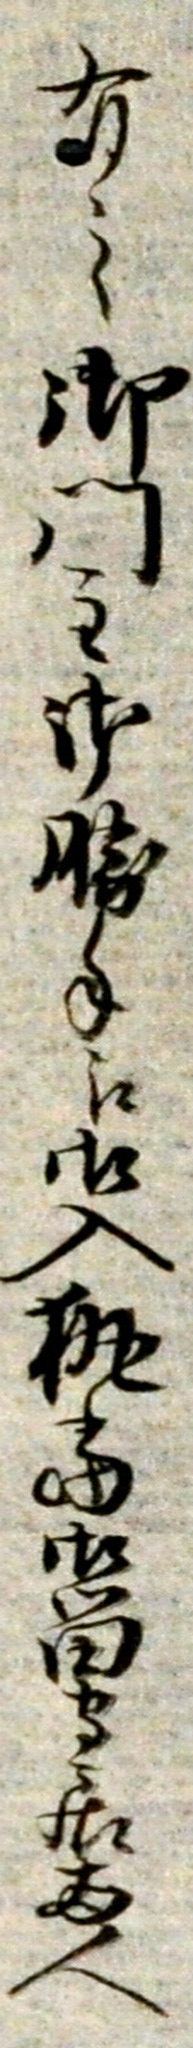有之御門主御勝手江御入執当御留守居両人
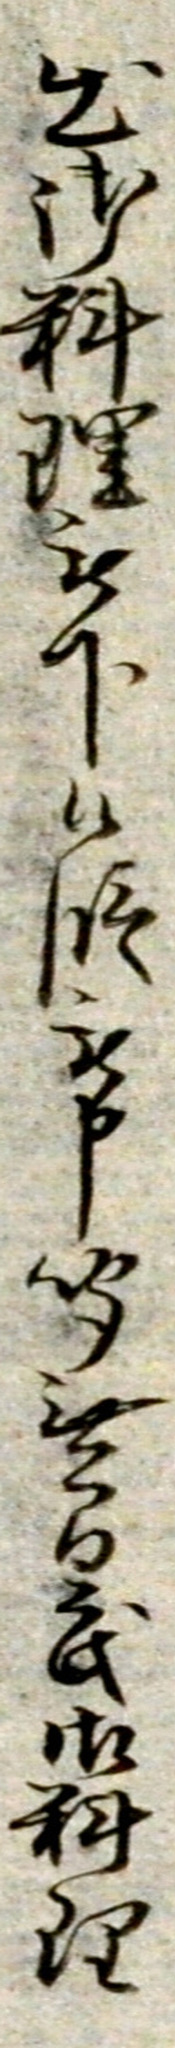出御料理被下候段被申聞無間茂御料理
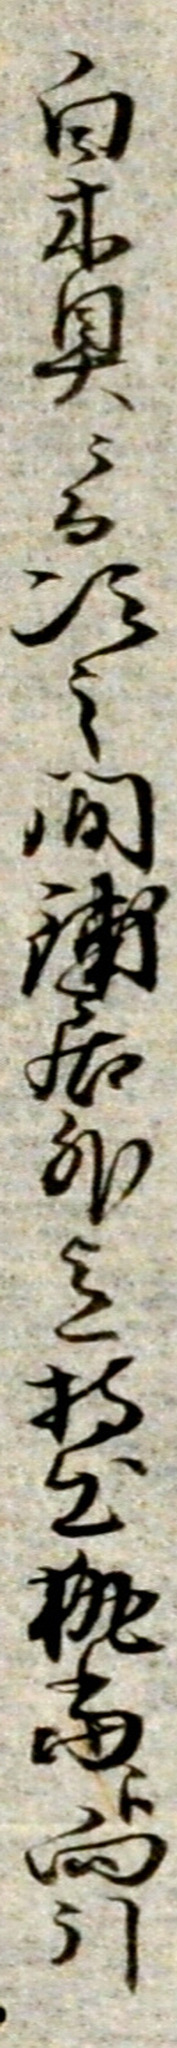白木具に而次之間鋪居外迄持出執当江向引
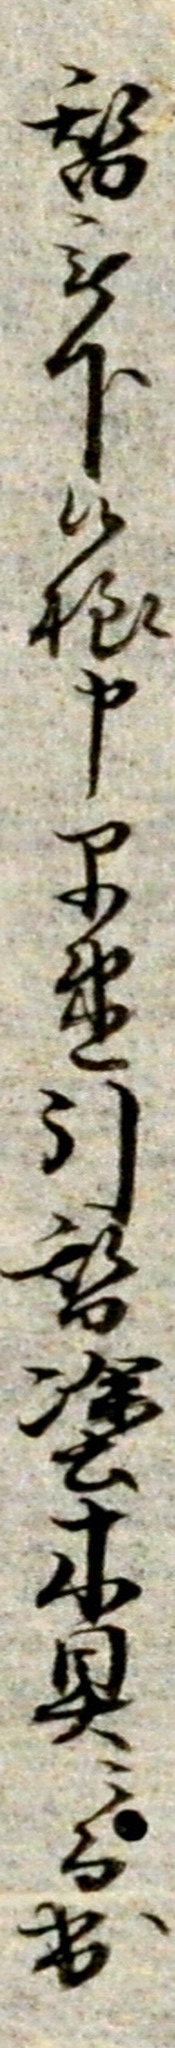替被下候様申早速引替塗木具ニ而出
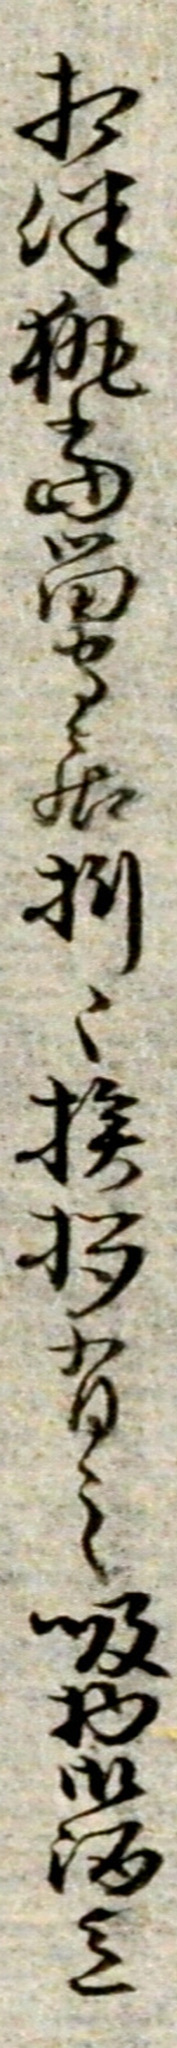相伴執当留守居折々挨拶有之吸物御酒迄
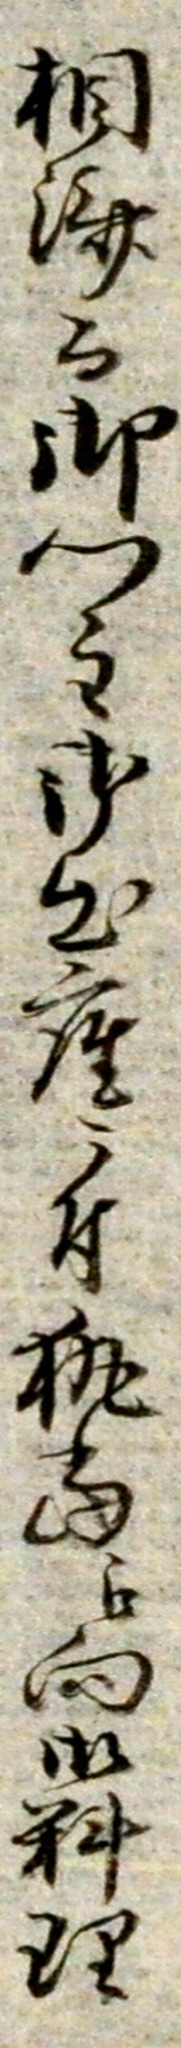相済而御門主御出座ニ付執当江向御料理
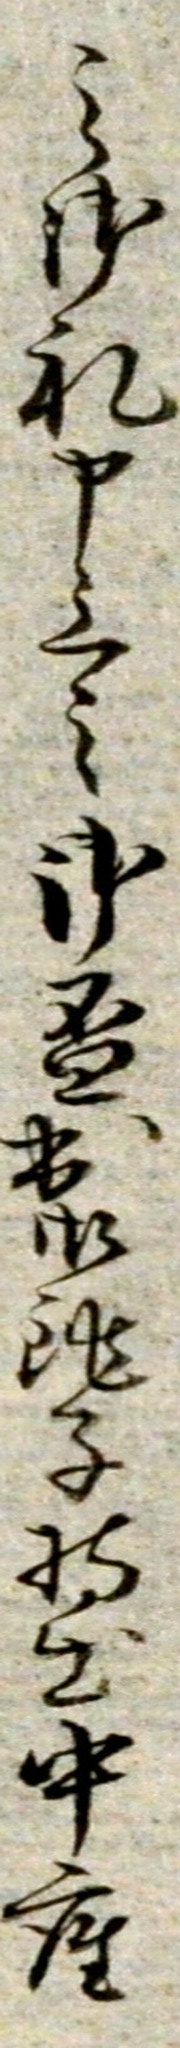之御礼申上之御盃出御銚子持出中座
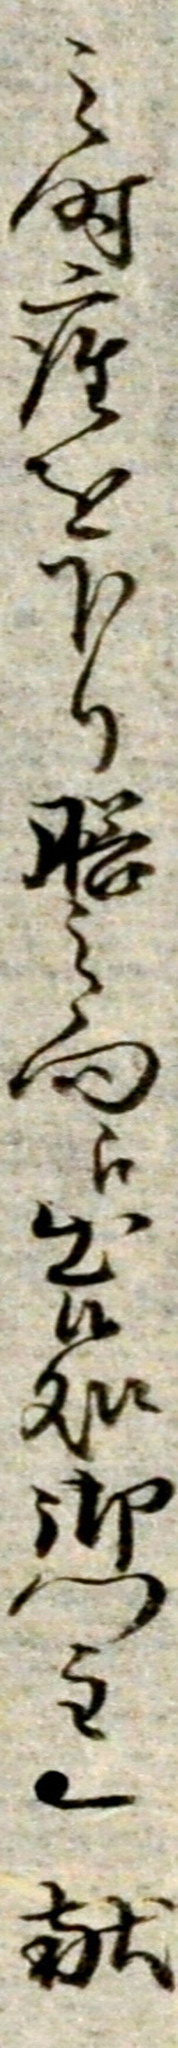之時座を下り膳之向江出候処御門主一献
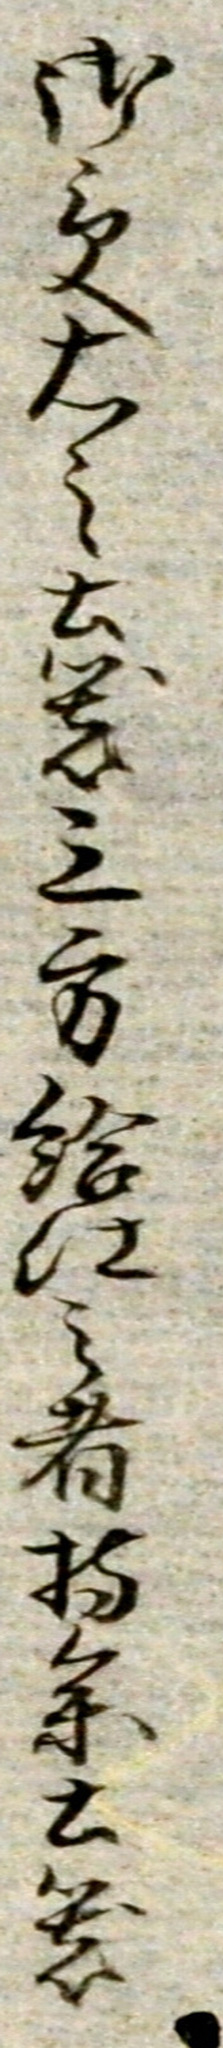御受右之土器三方給仕之者持参土器
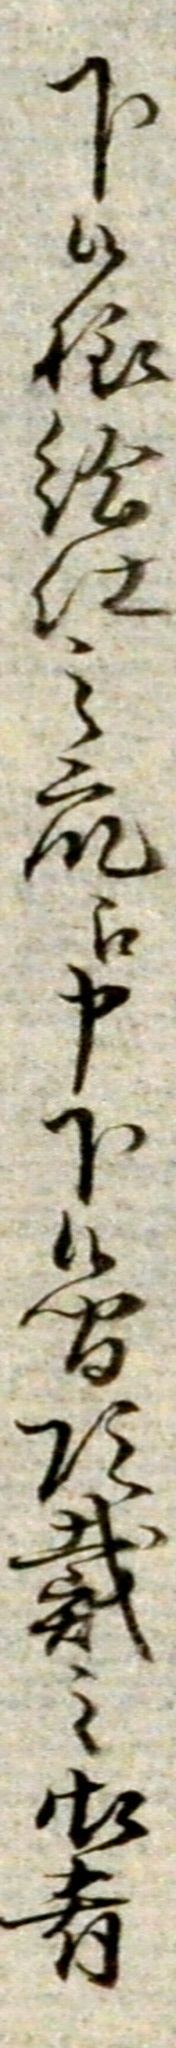下候様給仕之衆江申下候間頂戴之御肴
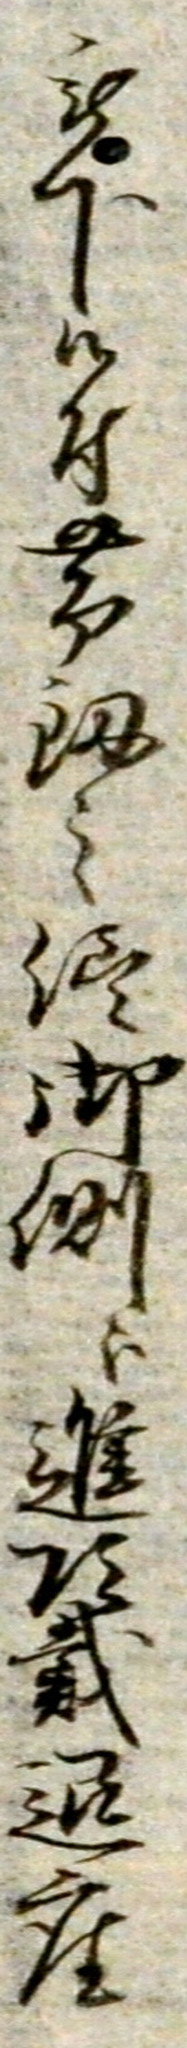被下候付帯剣之儘御側江進頂戴退座
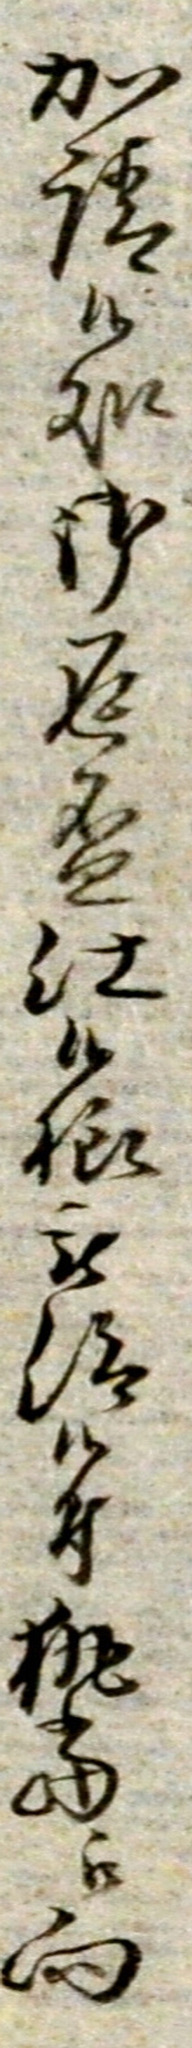加請候処御返盃仕候様被仰付執当江向
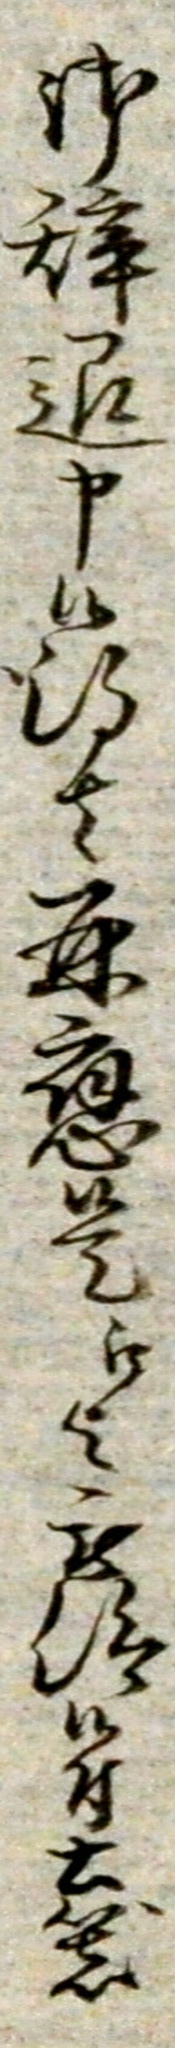御辞退申候得者再応是江与被仰候付土器
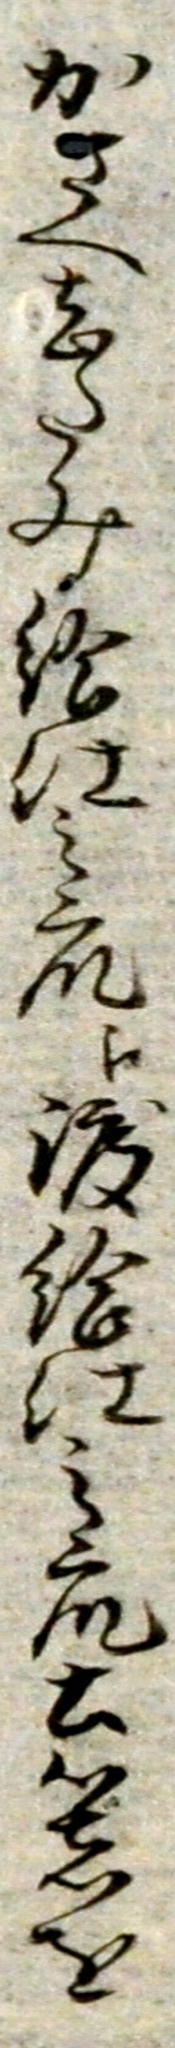かさへしたみ給仕之衆江渡給仕之衆土器を
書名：日光御名代相勤候節ノ留
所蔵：伊那市立高遠町図書館・合同会社AMANE
